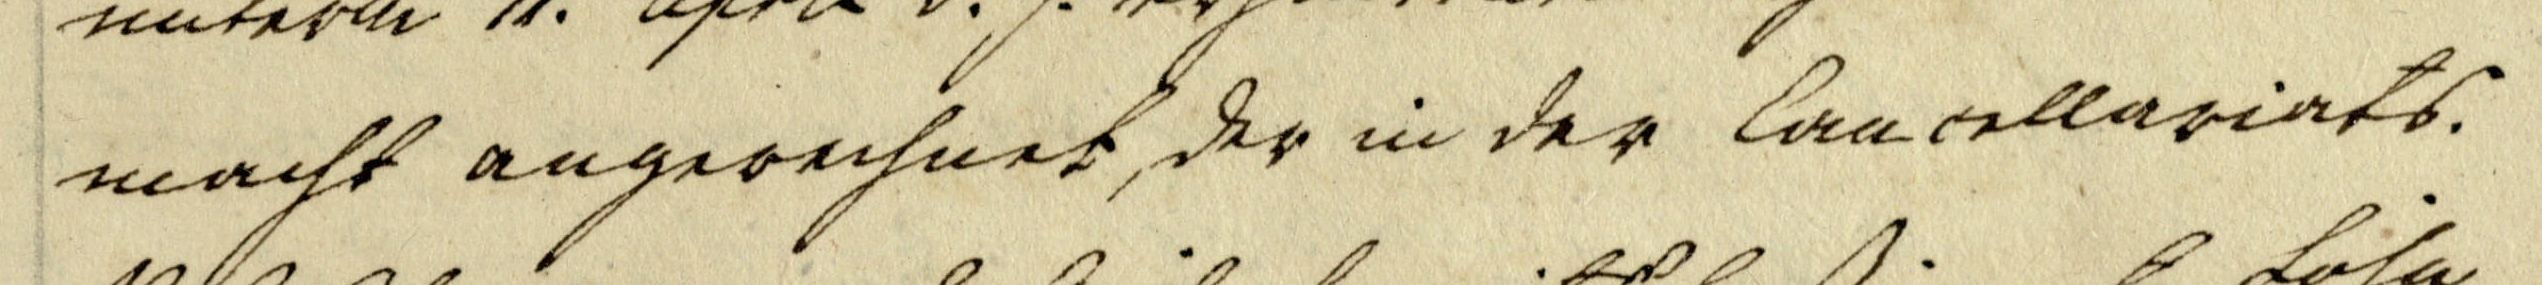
macht angerechnet, der in der Cancellariats¬
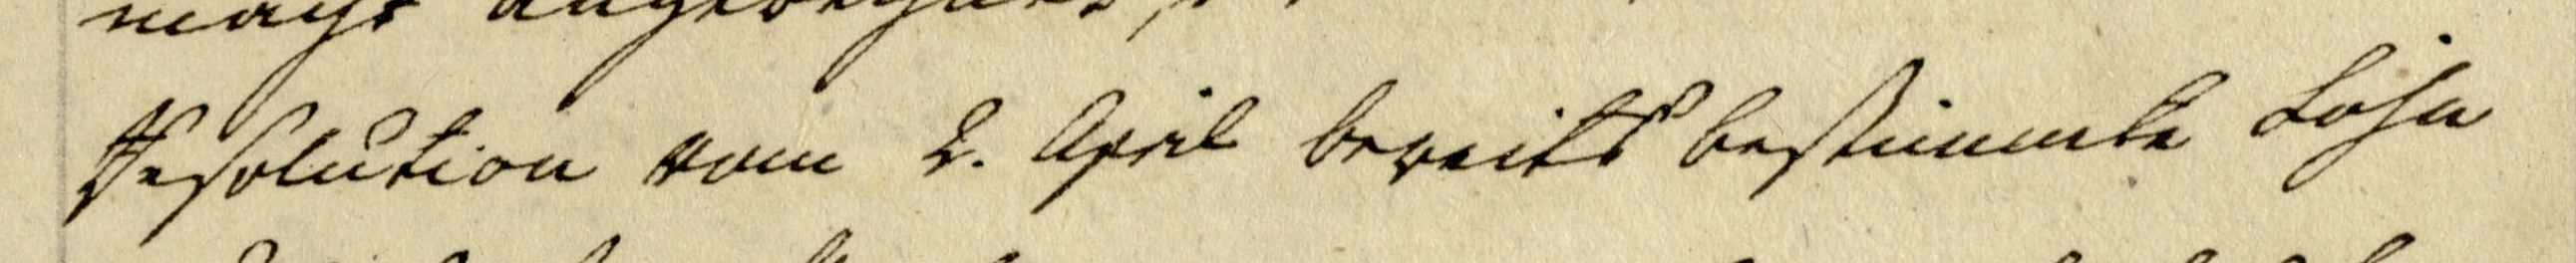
Resolution vom 2. April bereits bestimmte Lohn
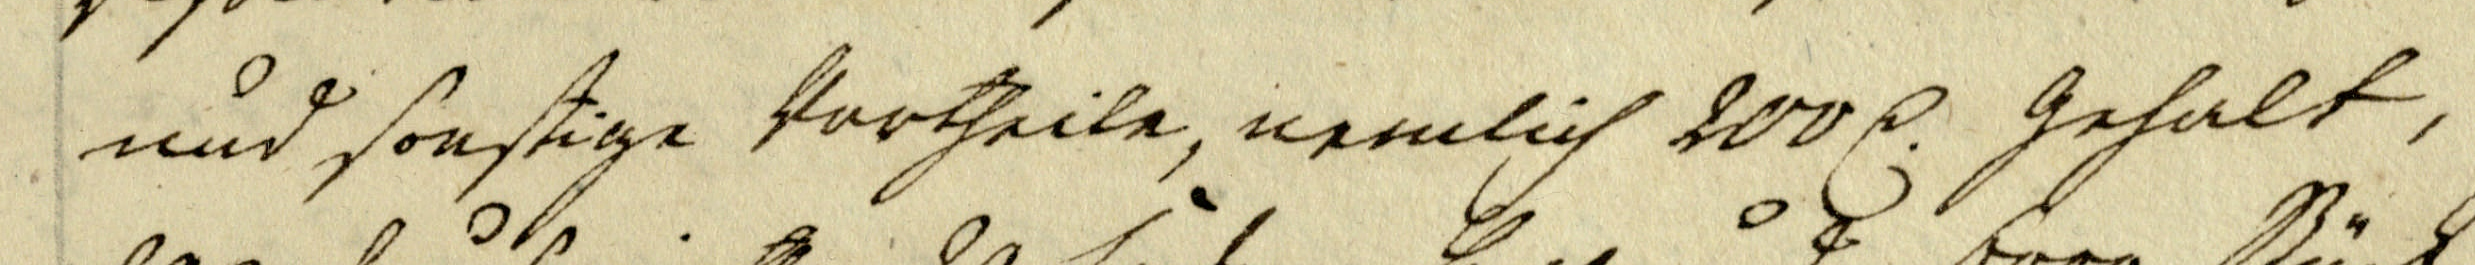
und sonstige Vortheile, nemlich 200 l. Gehalt,
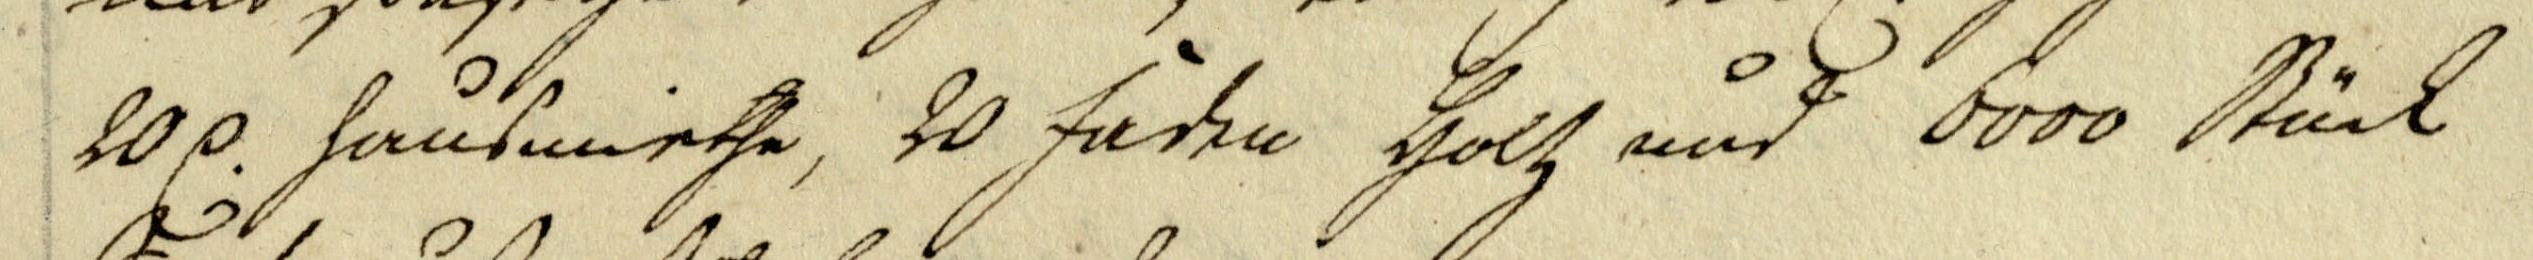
20 l. Hausmiethe, 20 Faden Holz und 6000 Stück
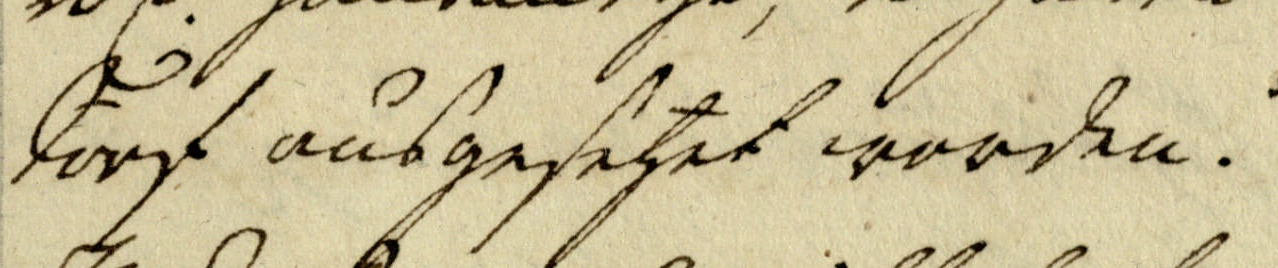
Torf ausgesetzet worden.
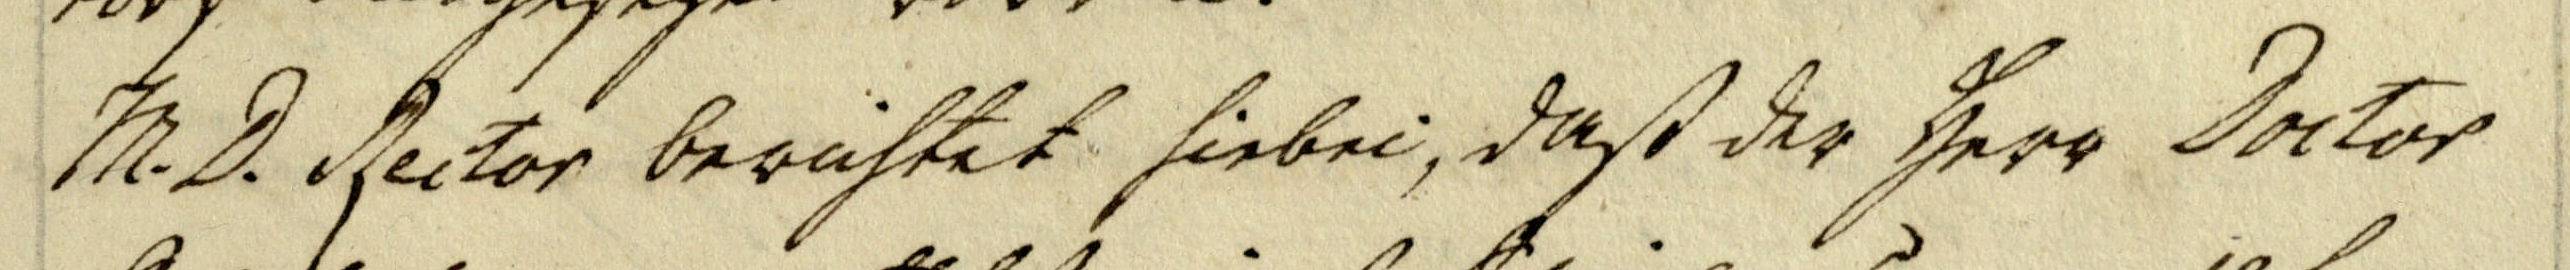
M. D. Rector berichtet hiebei, daß der Herr Doctor
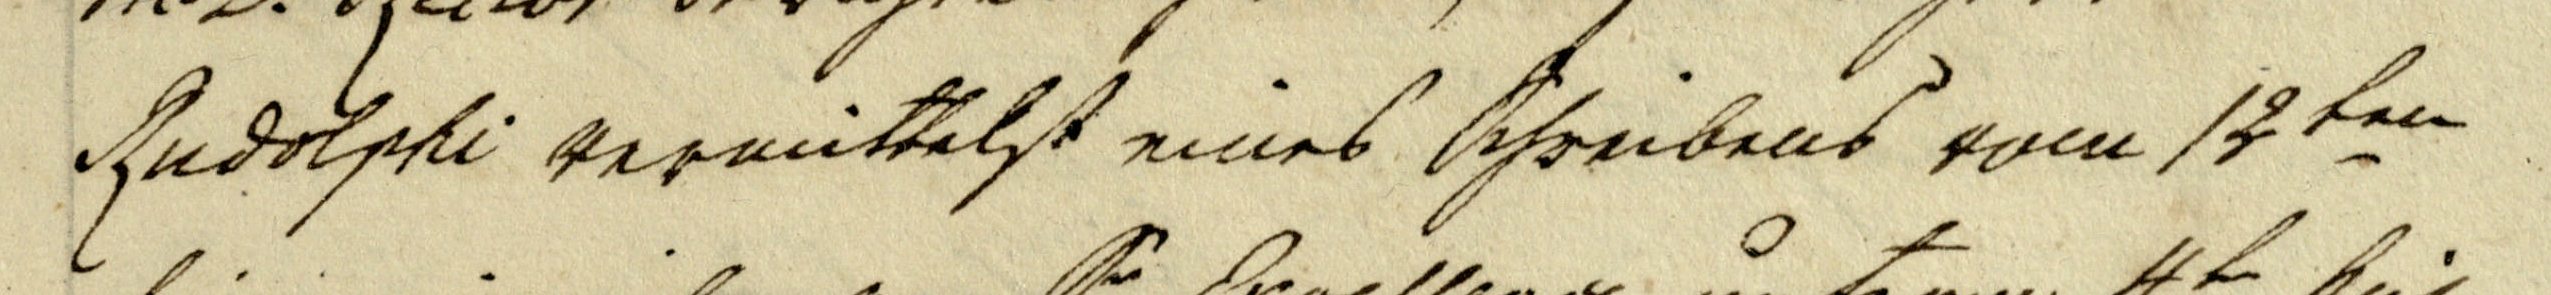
Rudolphi vermittelst eines Schreibens vom 12 ten
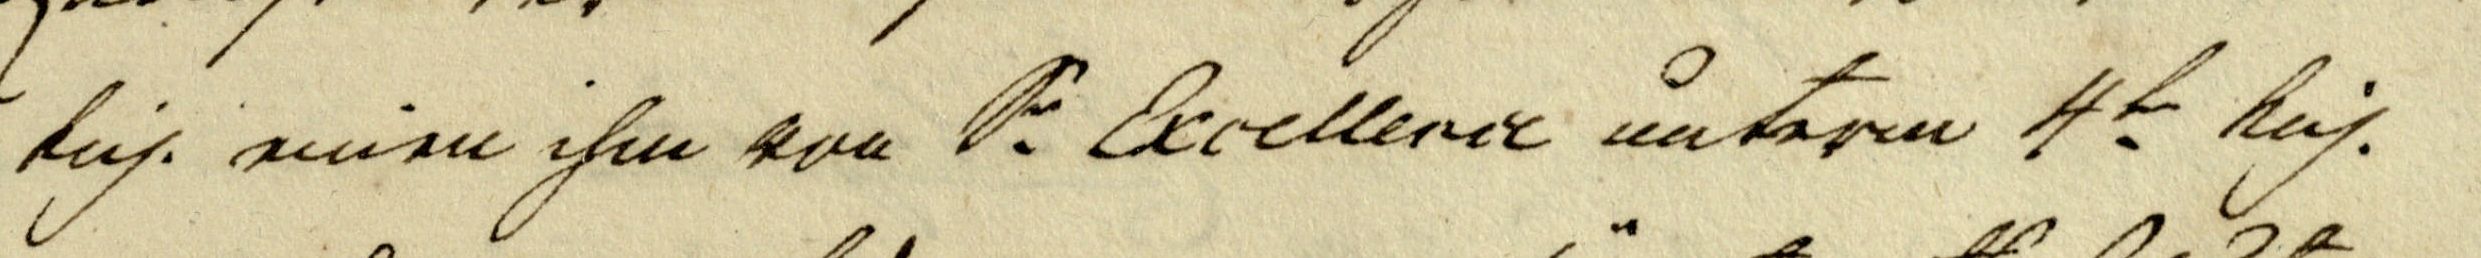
huj. einen ihm von Sr Excellence unterm 4 t. huj.
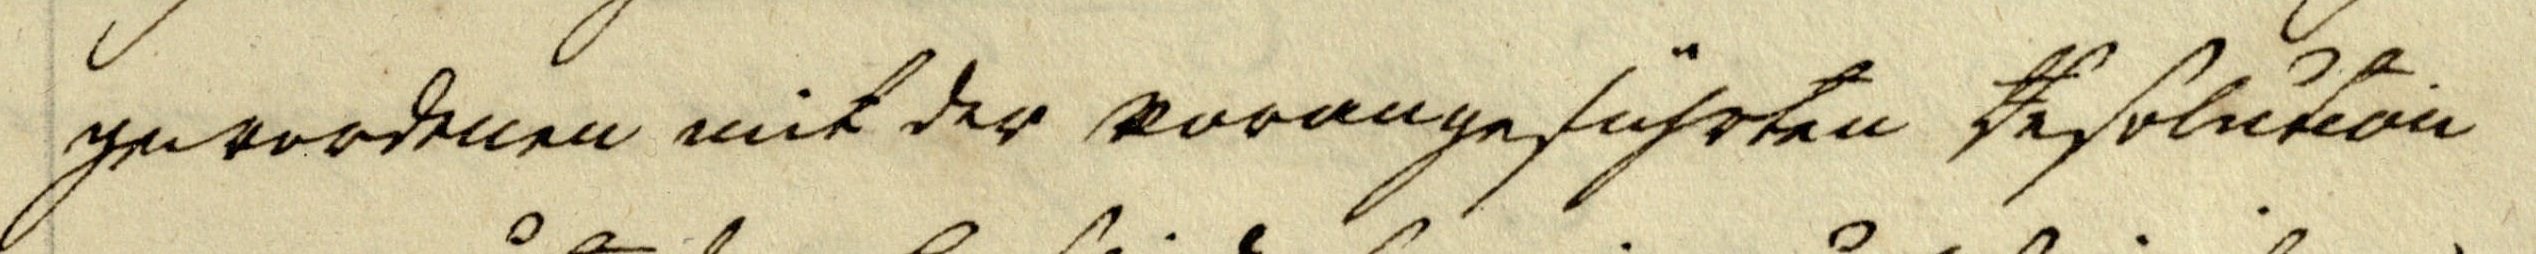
gewordenen mit der vorangeführten Resolution
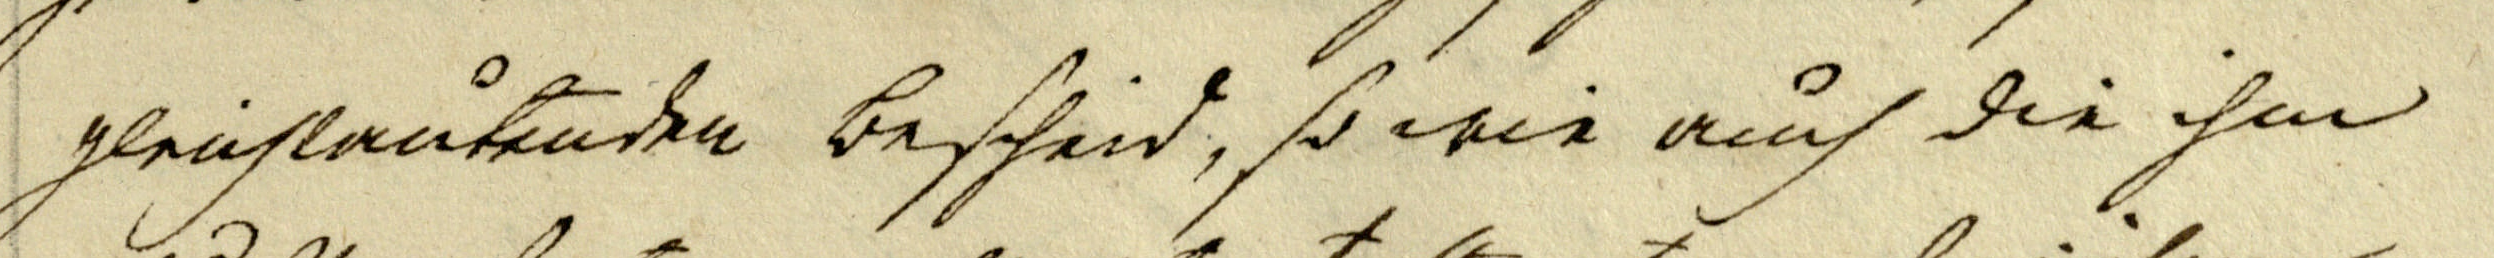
gleichlautenden Bescheid, so wie auch die ihm
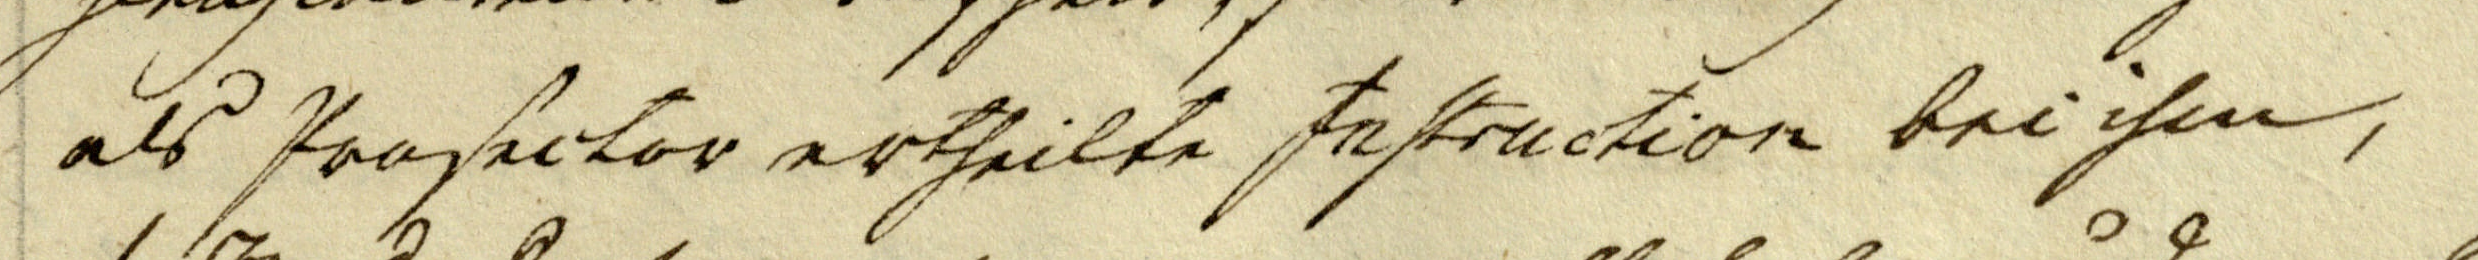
als Prosector ertheilte Instruction bei ihm,
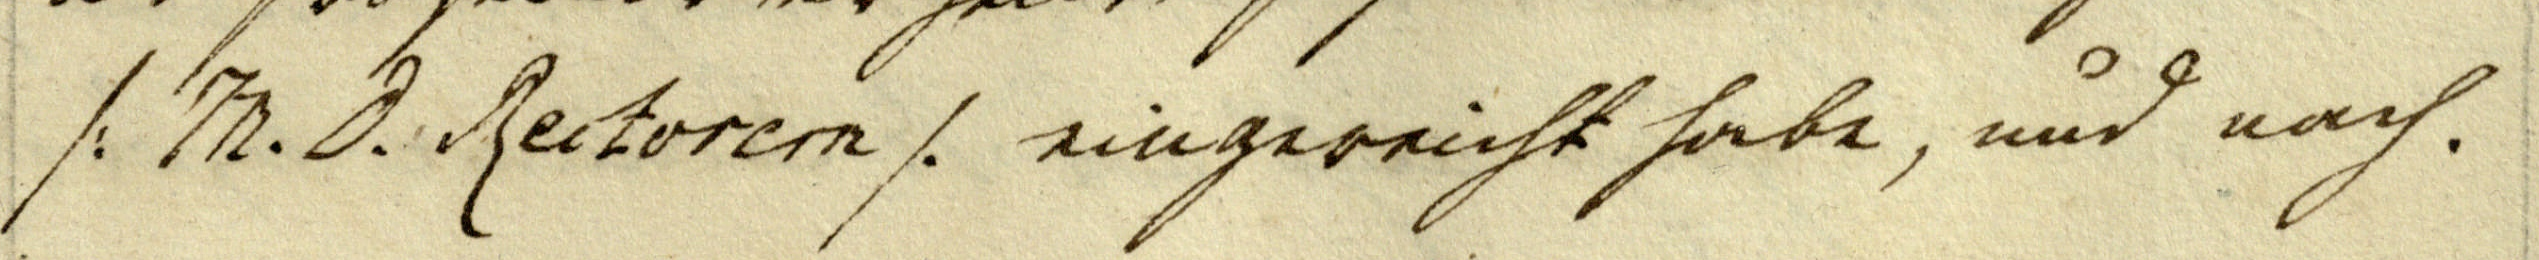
/: M. D. Rectorem /. eingereicht habe, und nach¬
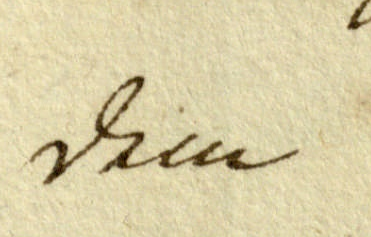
dem
